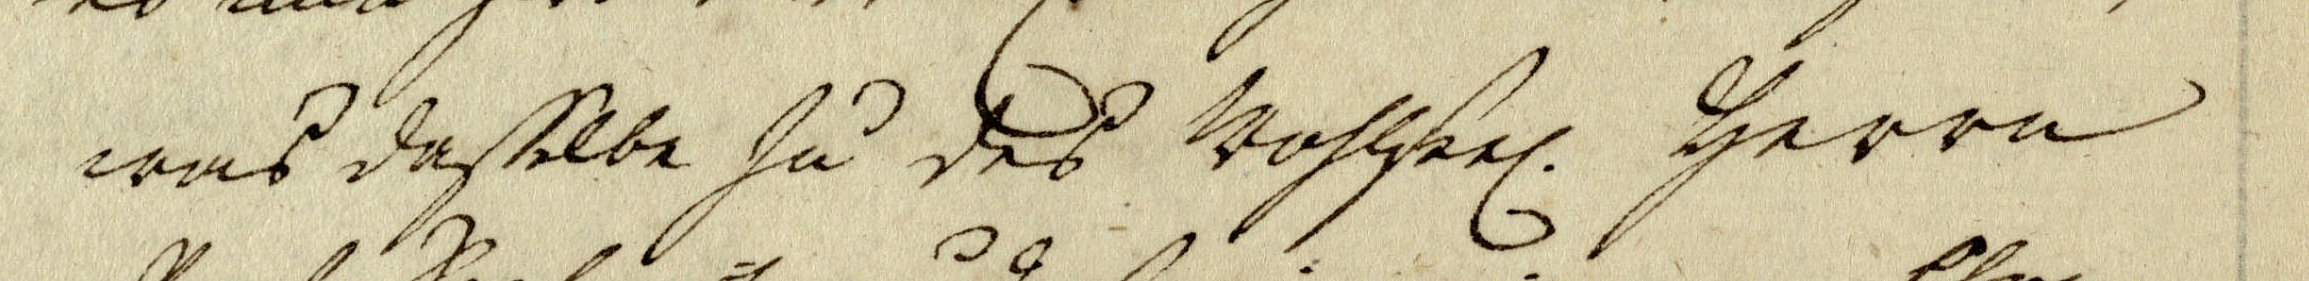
was dasselbe zu des Wohlseel. Herrn
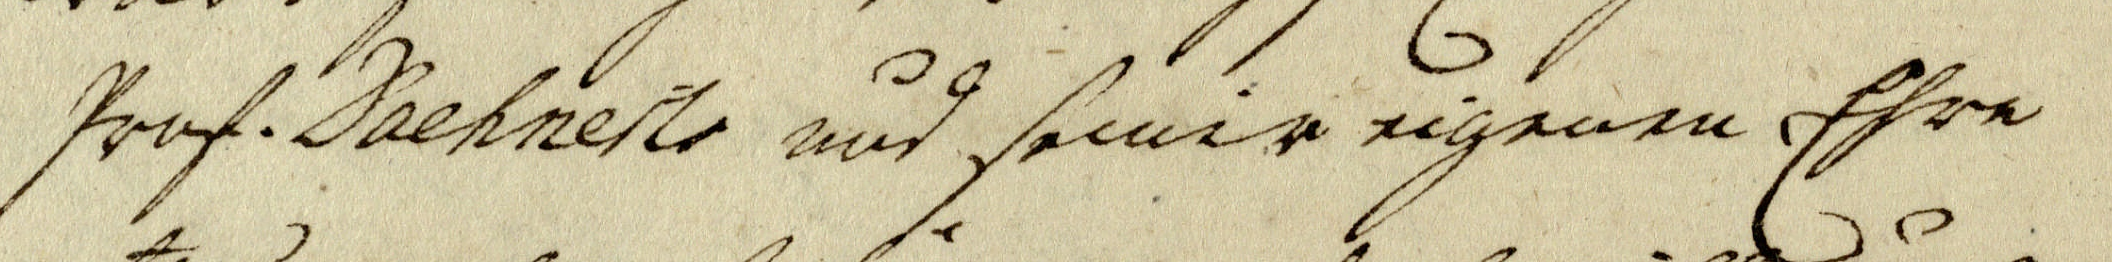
Prof. Daehnerts und seiner eigenen Ehre
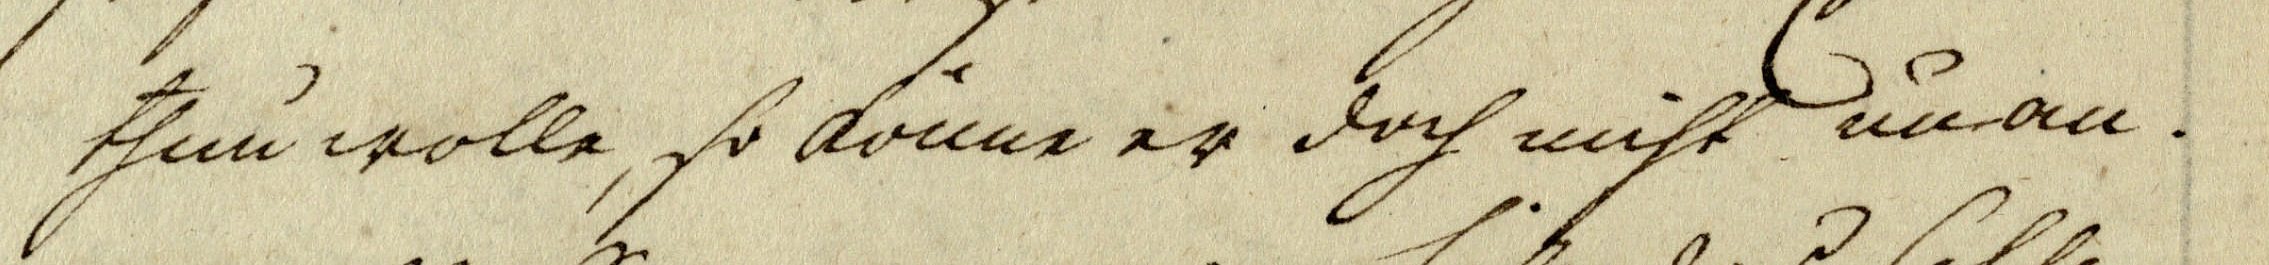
thun wolle, so könne er doch nicht unan¬
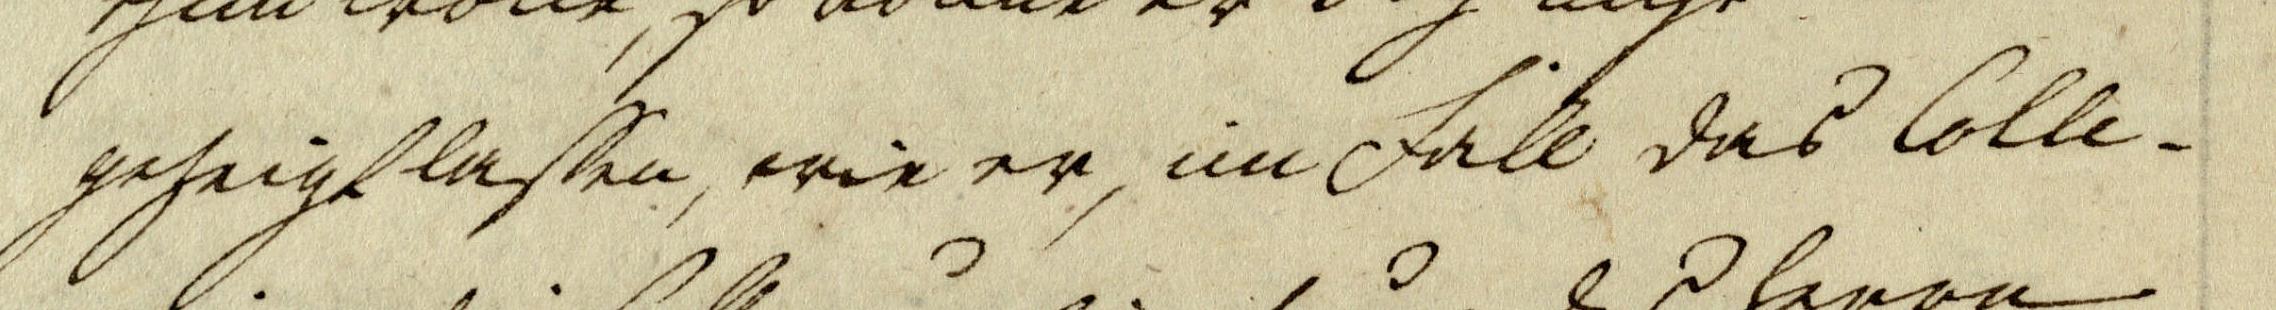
gezeigt lassen, wie er im Fall das Colle¬
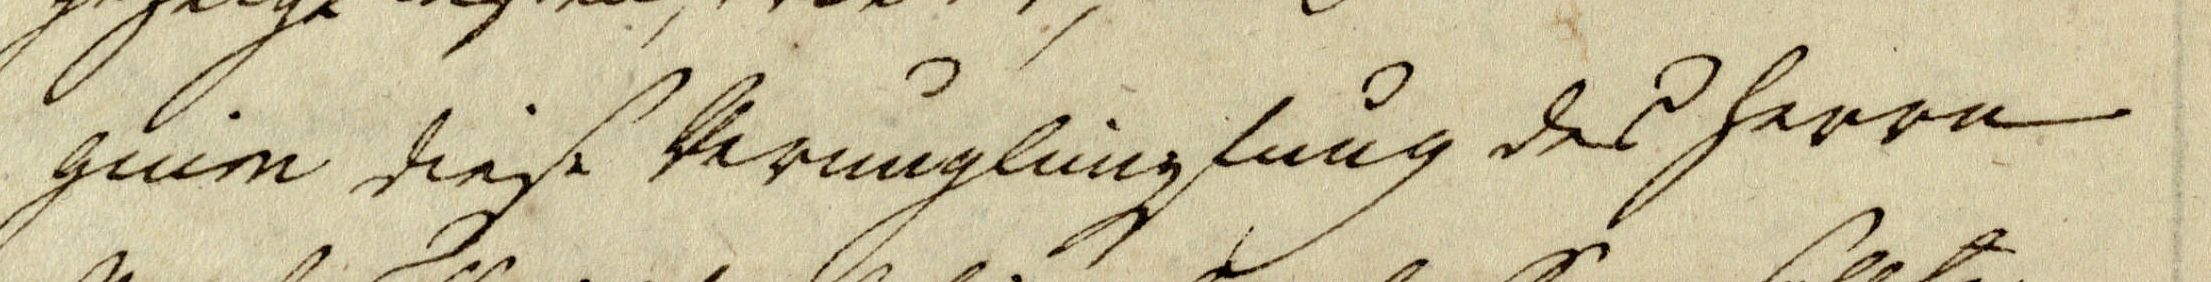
gium diese Verunglimpfung des Herrn
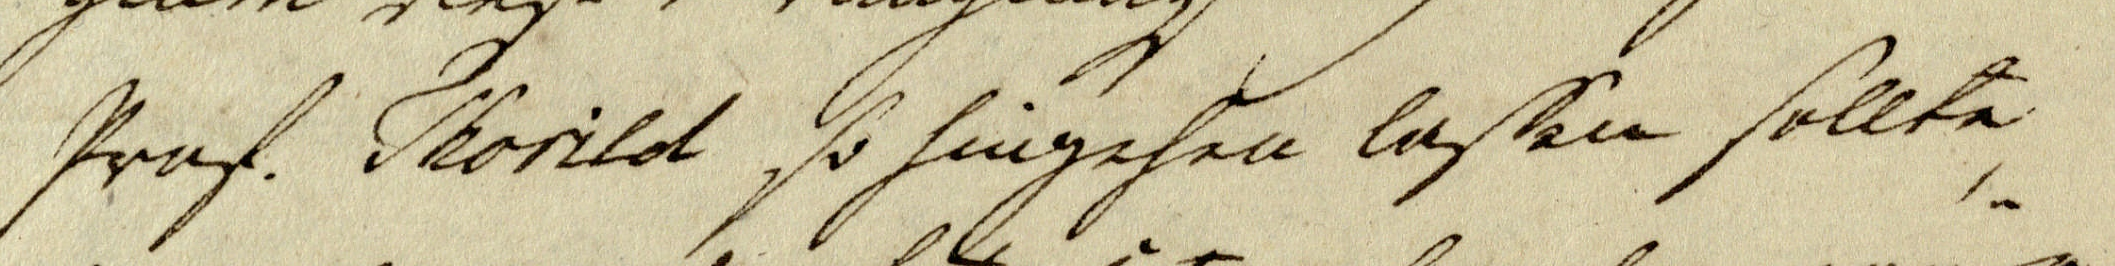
Prof. Thorild so hingehen lassen sollte,
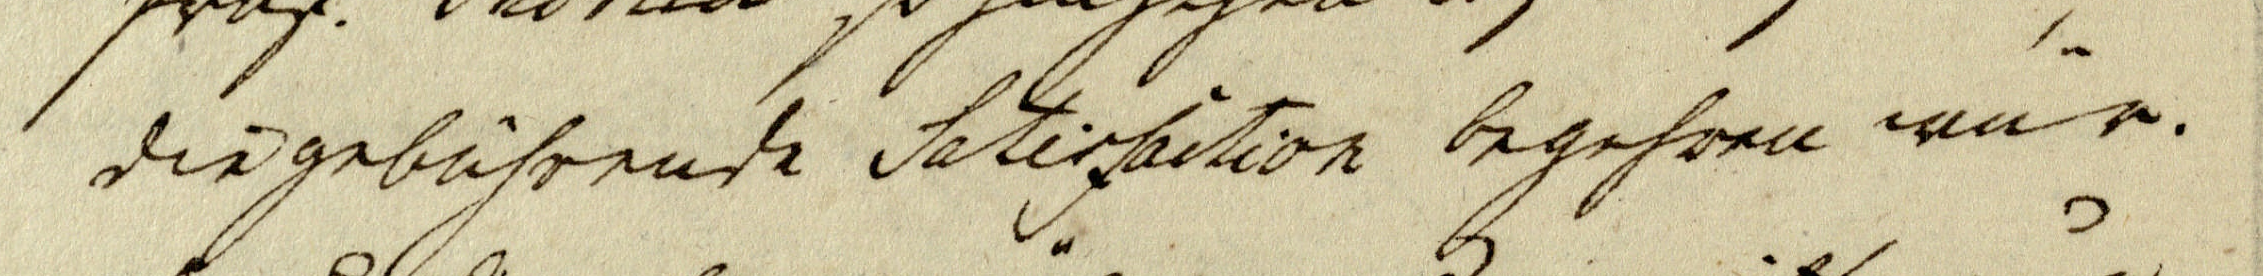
die gebührende Satisfaction begehren wür¬
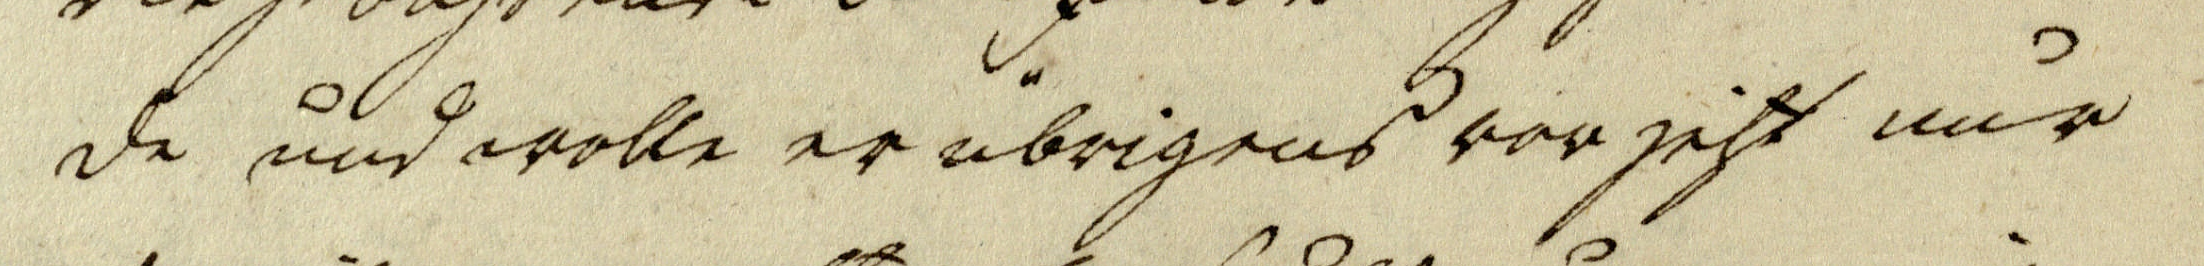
den und wolle er übrigens vor jetzt nur
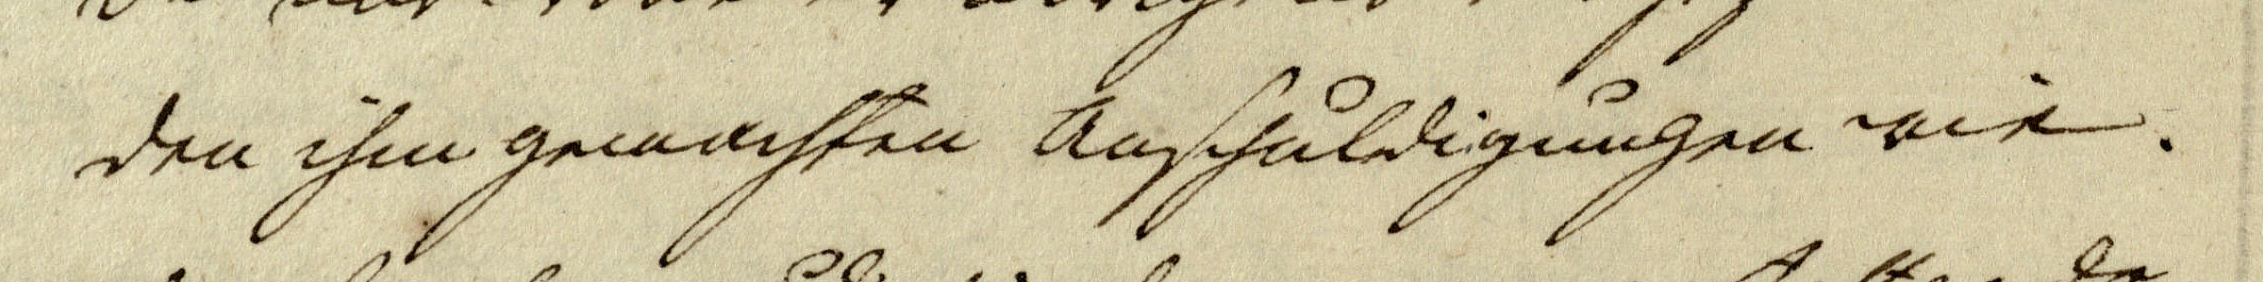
den ihm gemachten Anschuldigungen wie¬
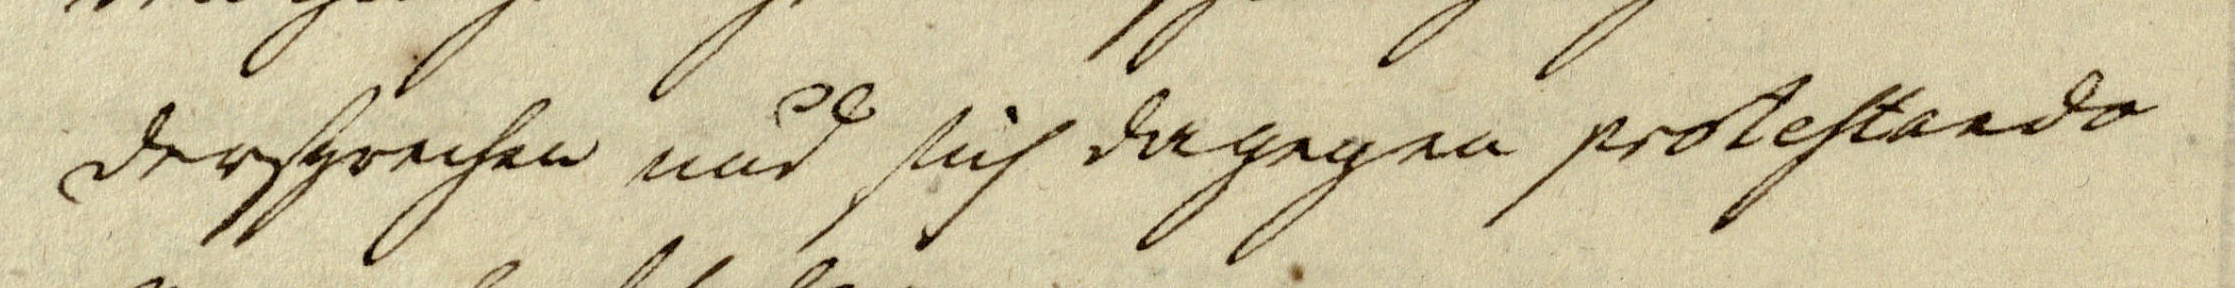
dersprechen und sich dagegen protestando
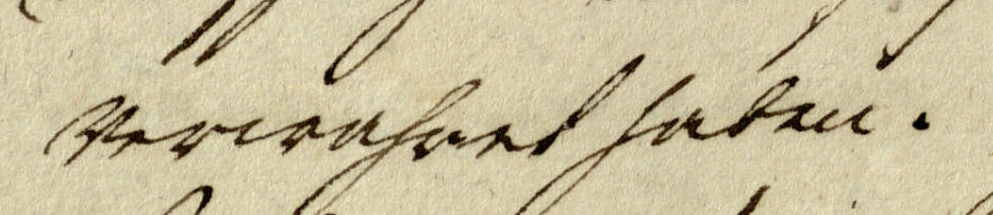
verwahret haben:
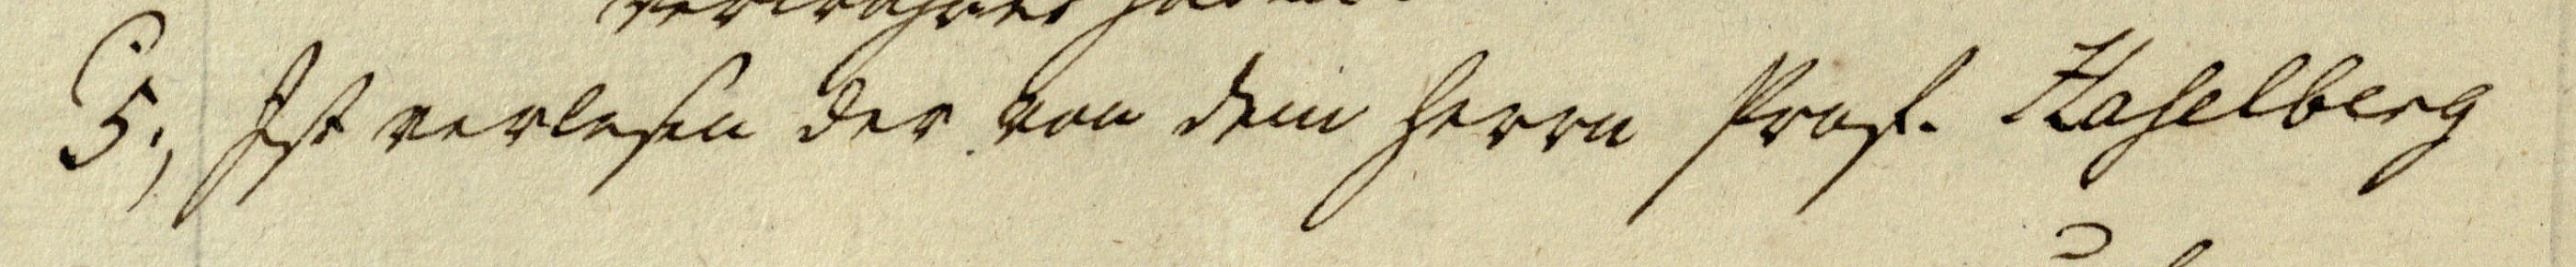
5., Ist verlesen der von dem Herrn Prof. Haselberg
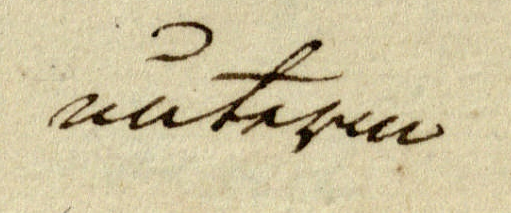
unterm
